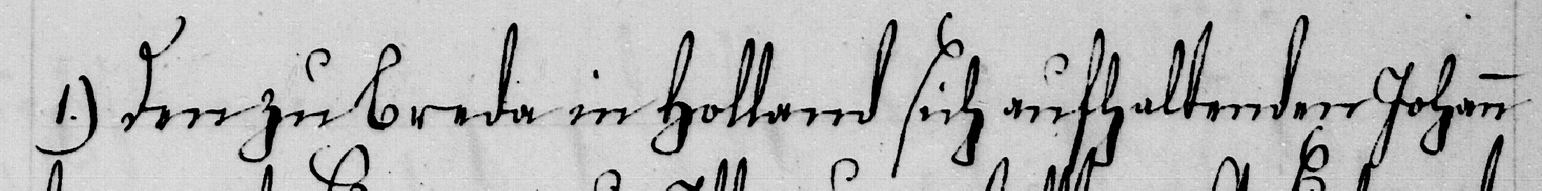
1.) Den zu Breda in Holland sich aufhaltenden Johann
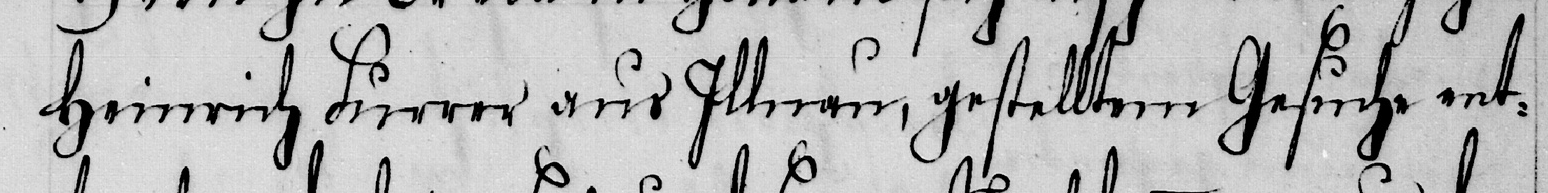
Heinrich Furrer aus Illnau, gestelltem Gesuche ent¬
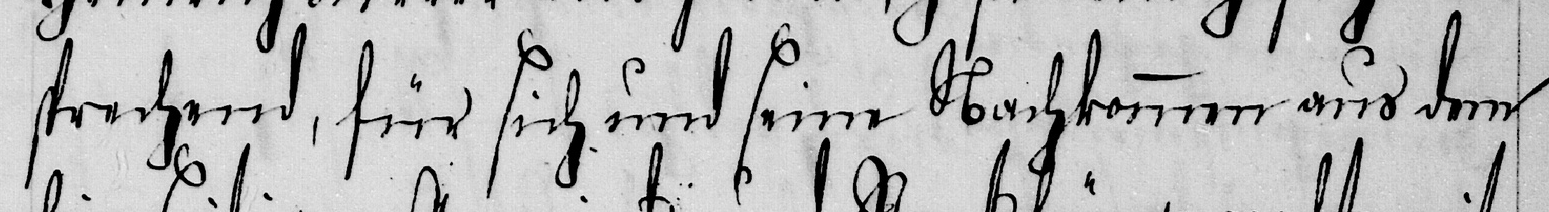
sprechend, für sich und seine Nachkommen aus dem
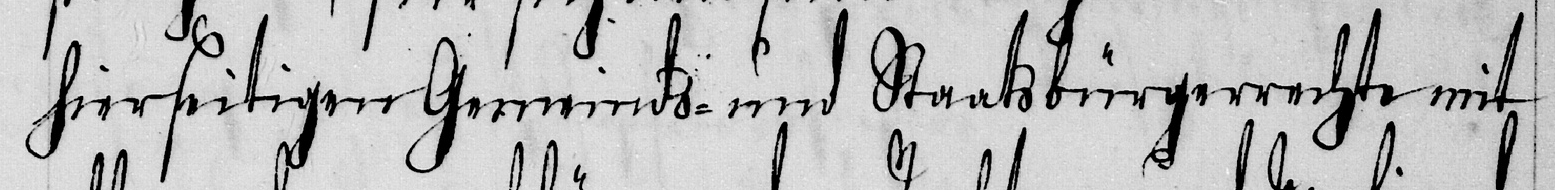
hierseitigen Gemeinds- und Staatsbürgerrechte mit
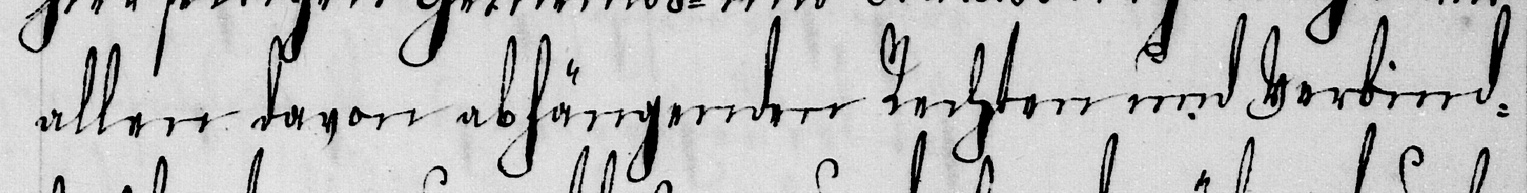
allen davon abhängenden Rechten und Verbind¬
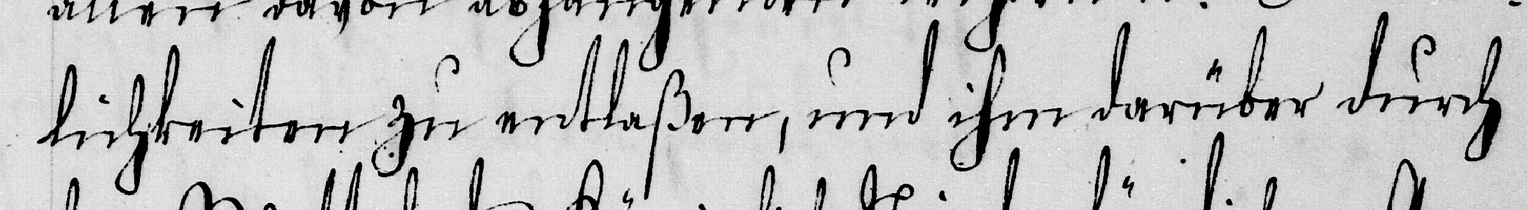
lichkeiten zu entlaßen, und ihm darüber durch
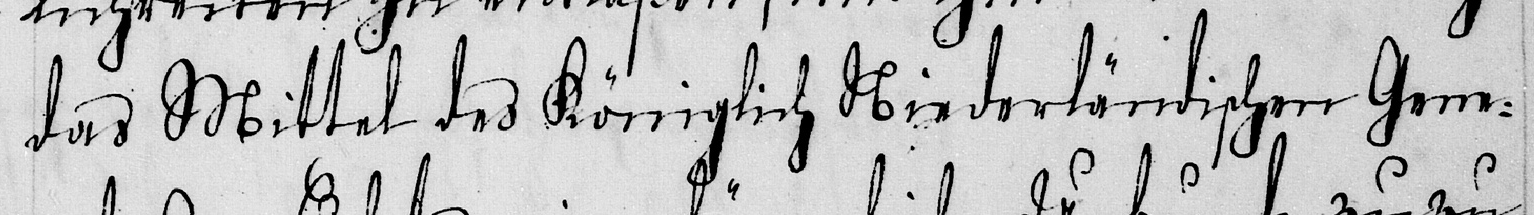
das Mittel des Königlich Niederländischen Gene¬
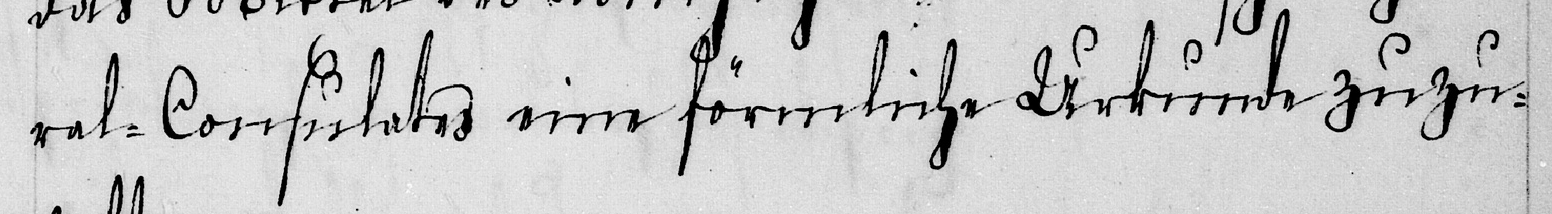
ral-Consulates eine förmliche Urkunde zu zu¬
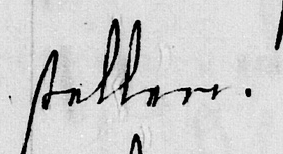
stellen.
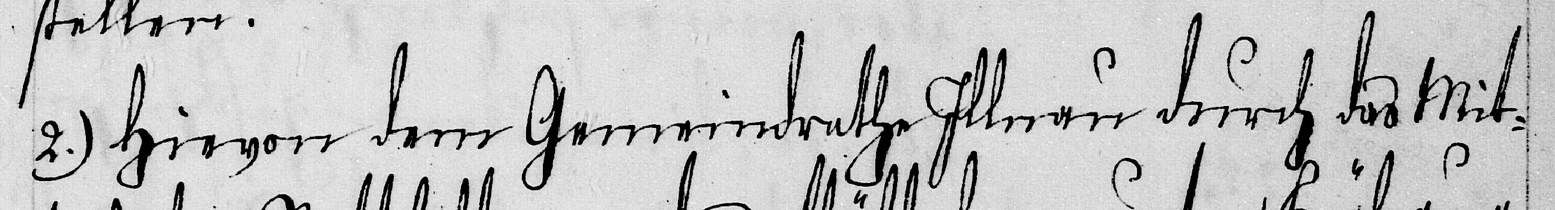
2.) Hievon dem Gemeindrathe Illnau durch das Mit¬
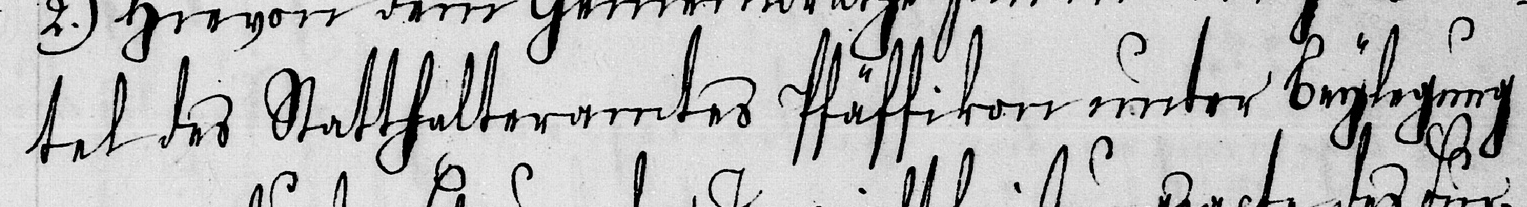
tel des Statthalteramtes Pfäffikon unter Beylegung
